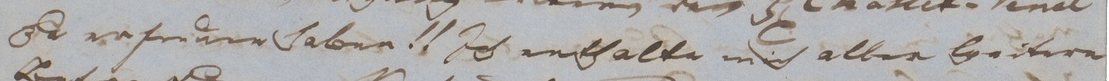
zu erfreuen haben!! Ich enthalte mich aller weitern
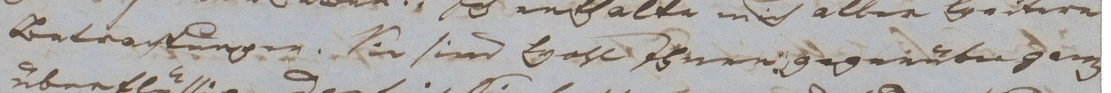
Betrachtungen. Sie sind wohl Ihnen gegenüber ganz
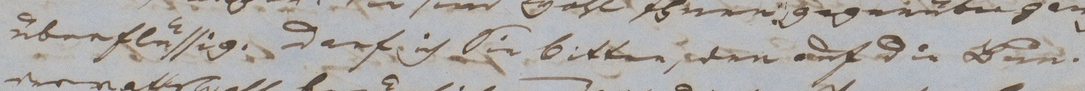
überflüssig. Darf ich Sie bitten, den auf die Bun-
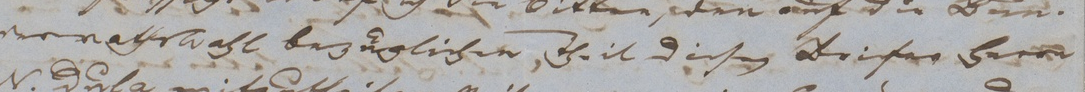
desrathswahl bezüglichen Theil dieses Briefes Herrn
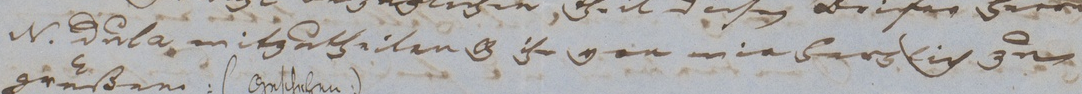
N. Dula mitzutheilen & ihn von mir herzlich zu
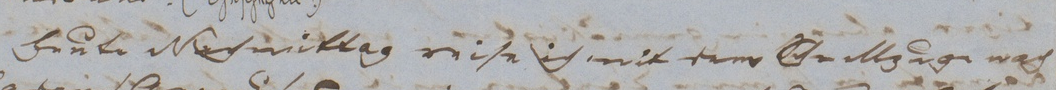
Heute Nachmittag reise ich mit dem Schnellzuge nach
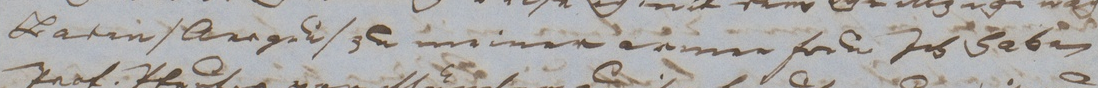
Baden (Aargau) zu meiner armen Frau. Ich habe
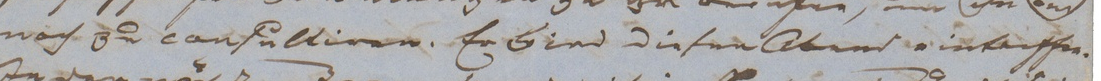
noch zu consultiren. Er wird diesen Abend eintreffen.
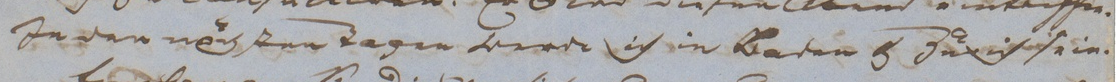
In den nächsten Tagen werde ich in Baden & Zürich sein.
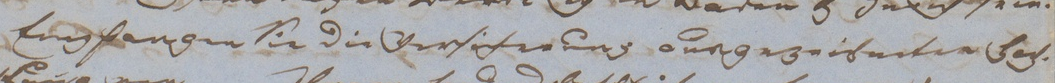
Empfangen Sie die Versicherung ausgezeichneter Hoch-
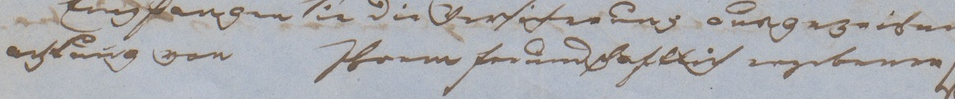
achtung von Ihrem freundschaftlich ergebenen
